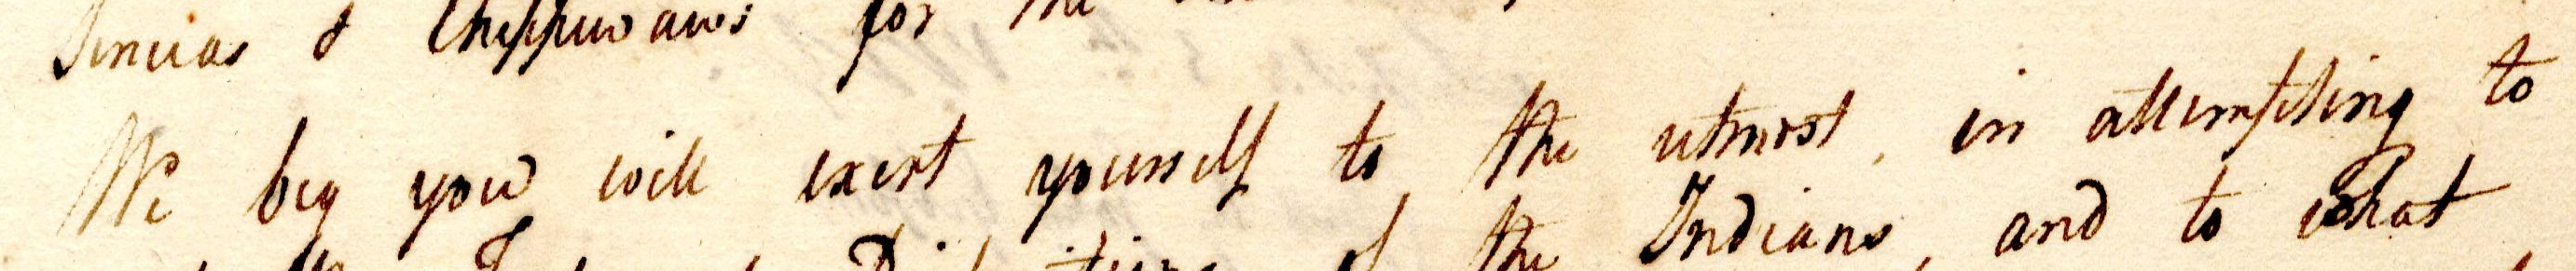We beg you will exert yourself to the utmost in attempting to
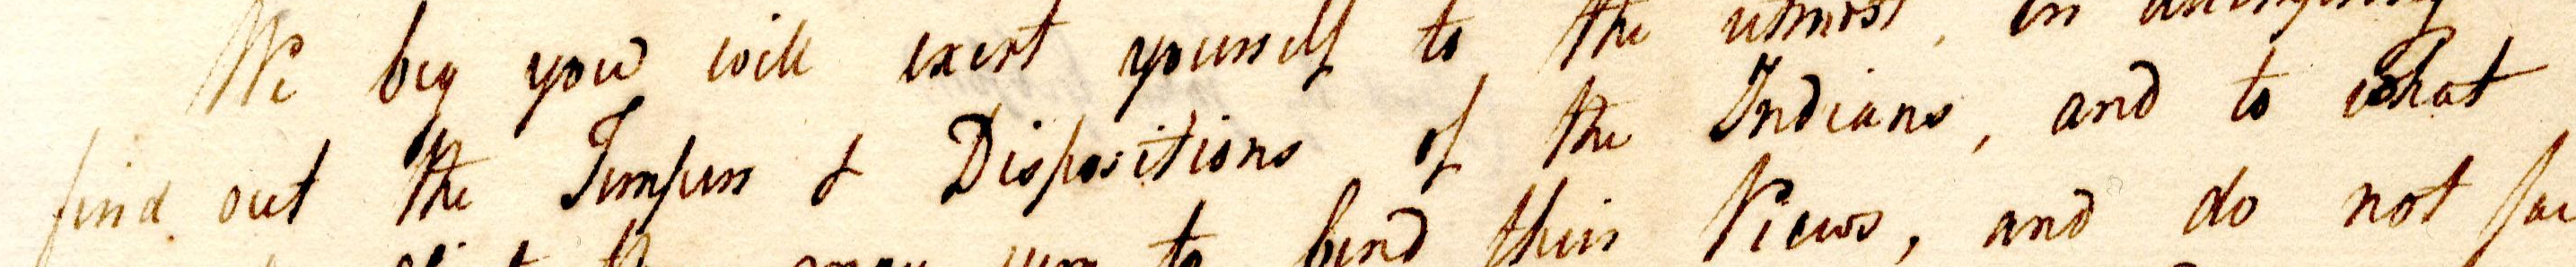find out the Temper & Dispositions of the Indians, and to what
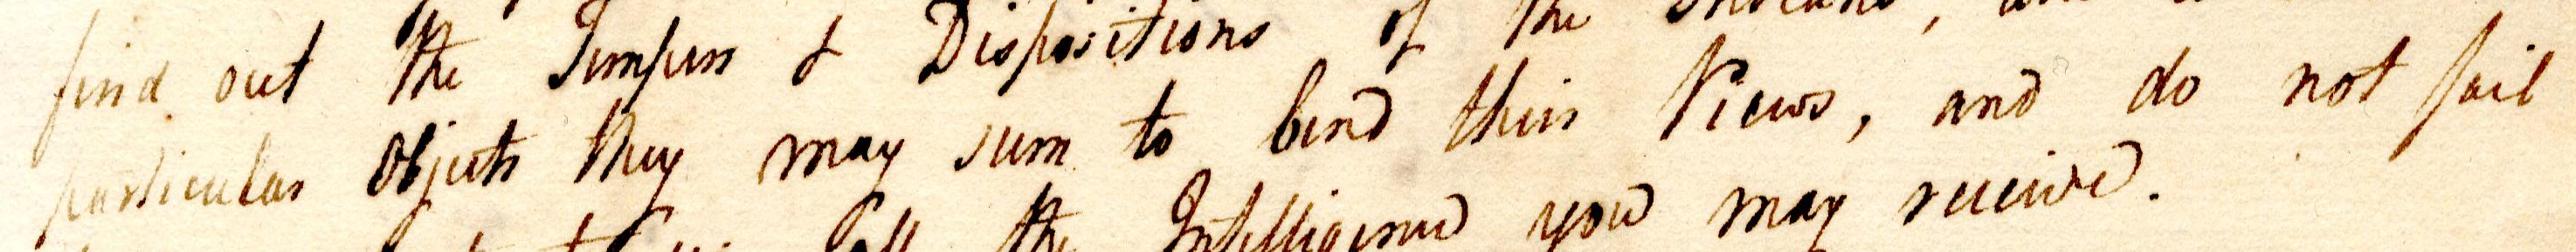particular Objects they may sum to bend their Views, and do not fail
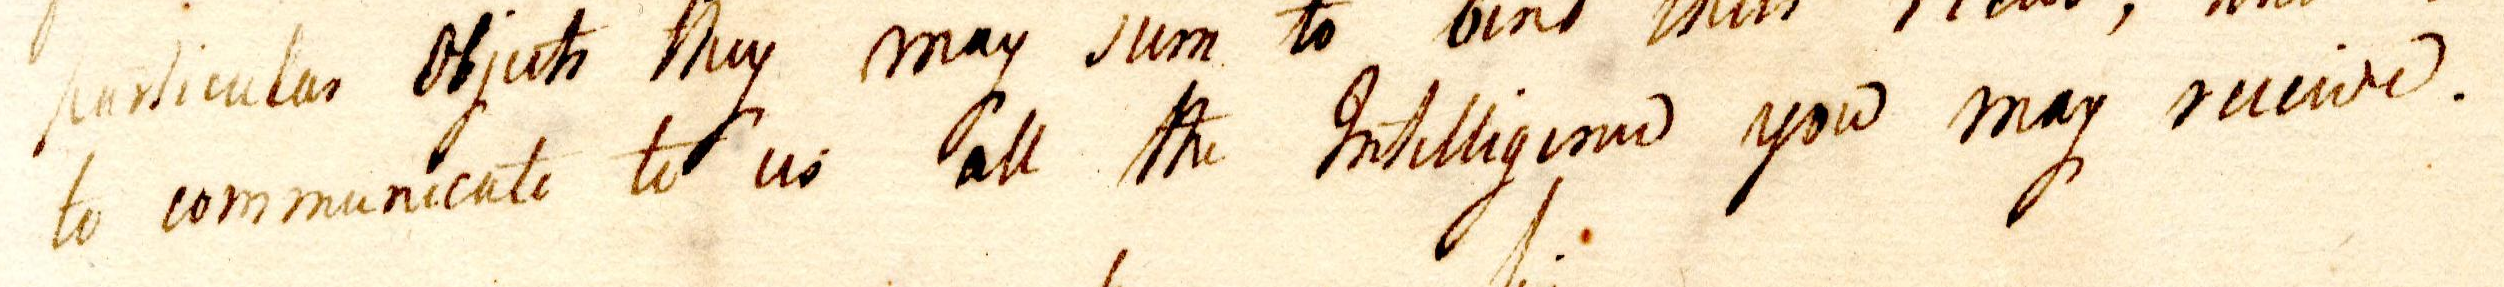to communicate to us all the Intelligence you may receive.
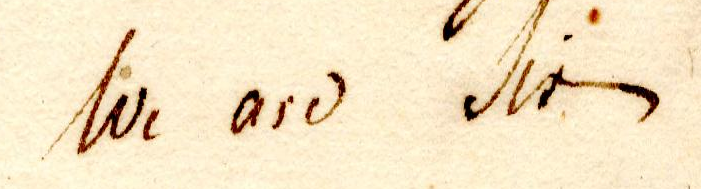We are Sir
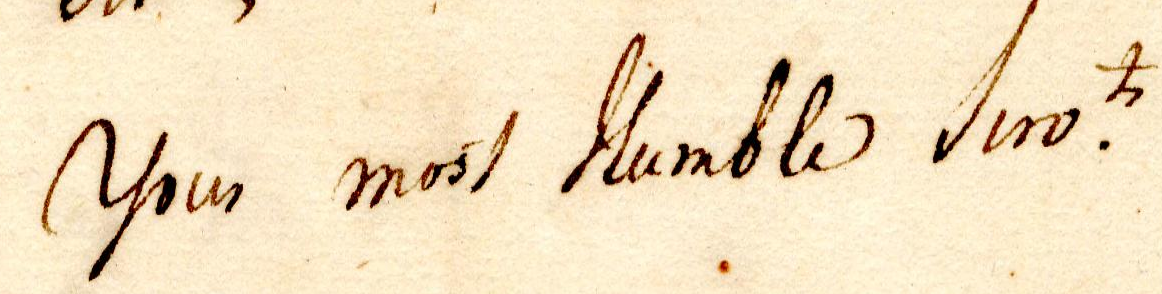Your most Humble Serv^t.
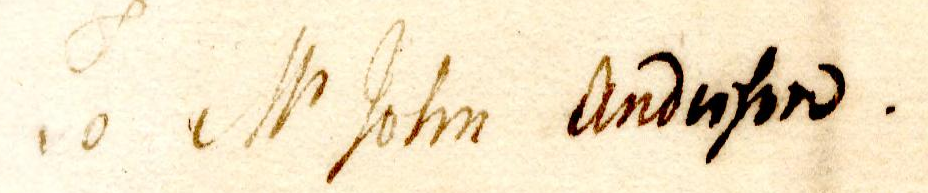To M^r John Anderson.
